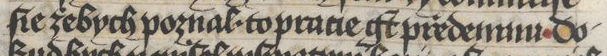ſie żebych poznal.to pracie ḡt pṙedemnu.Do¬
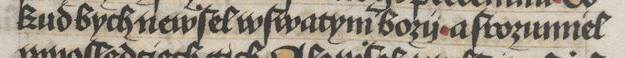kud bych newẛel wſwatym bozij.a ſrozumiel
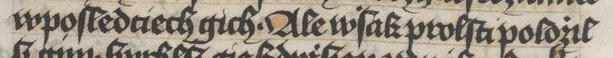wpoſledciech gich.Ale wẛak prolſti polożil
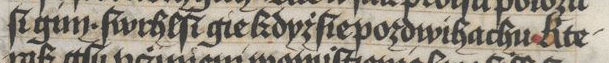ſi gim.ſwrhlſi gie kdyż ſie pozdwihachu.Kte¬
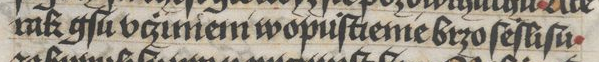rak gſu vcżinieni wopuẛtienie brzo ſeẛli ſu.
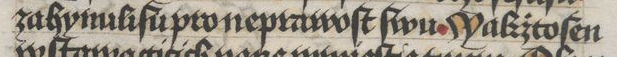zahynuliſu pro neprawoſt ſwu.Yakżtoſen
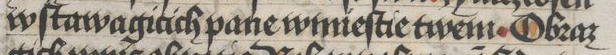wſtawagicich pane wmieſtie twem.Obraz¬
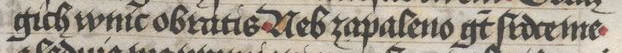gich wnic obratis.Neb zapaleno ḡt ſrdce me.
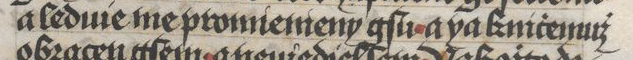a leduie me promienieny gſu.a ya kniċemuż
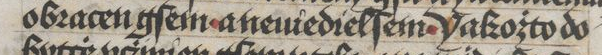obracen gſem.a neuiedielſem.Yakożto do¬
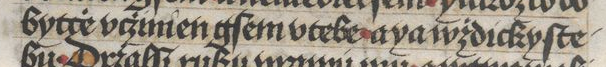bytċe vcżinien gſem vtebe.a ya wżdicky ſte¬
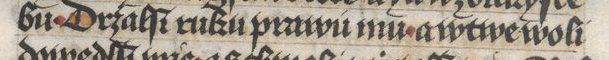bu.Drżalſi ruku prawu mu.a w twe woli
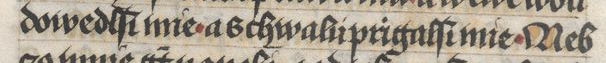dowedlſi mie.a schwalu pṙigalſi mie.Neb
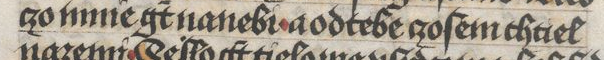czo mnie ḡt nanebi.a odtebe czoſem chtiel
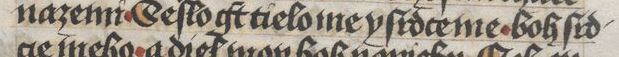nezemi.Seẛlo ḡt tielo me y ſrdce me.boh ſrd¬
